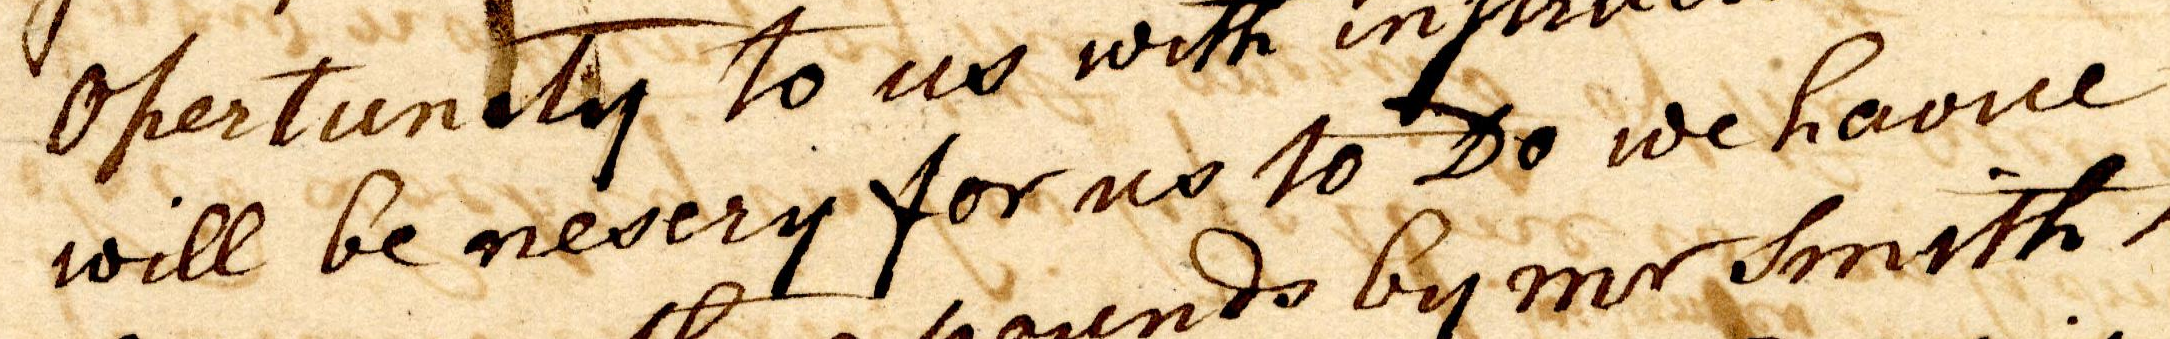will be nesery for us to Do we havue
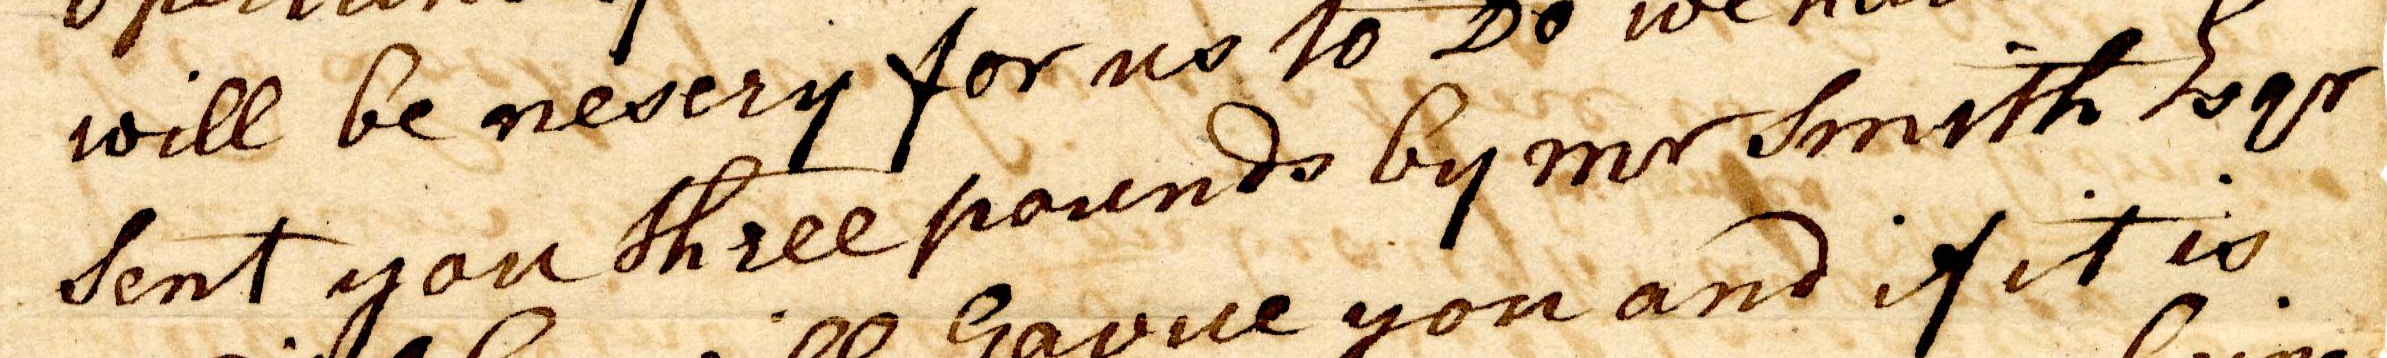Sent you three pounds by mr Smith Esqr
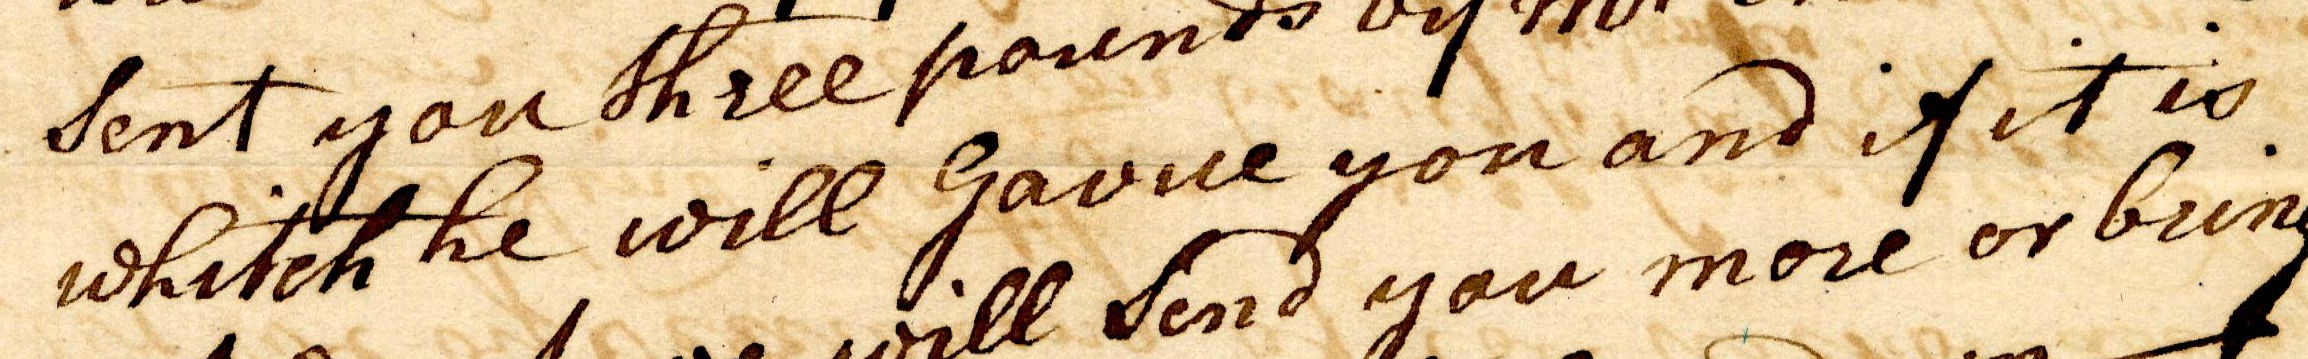whitch he will Gavue you and if it is
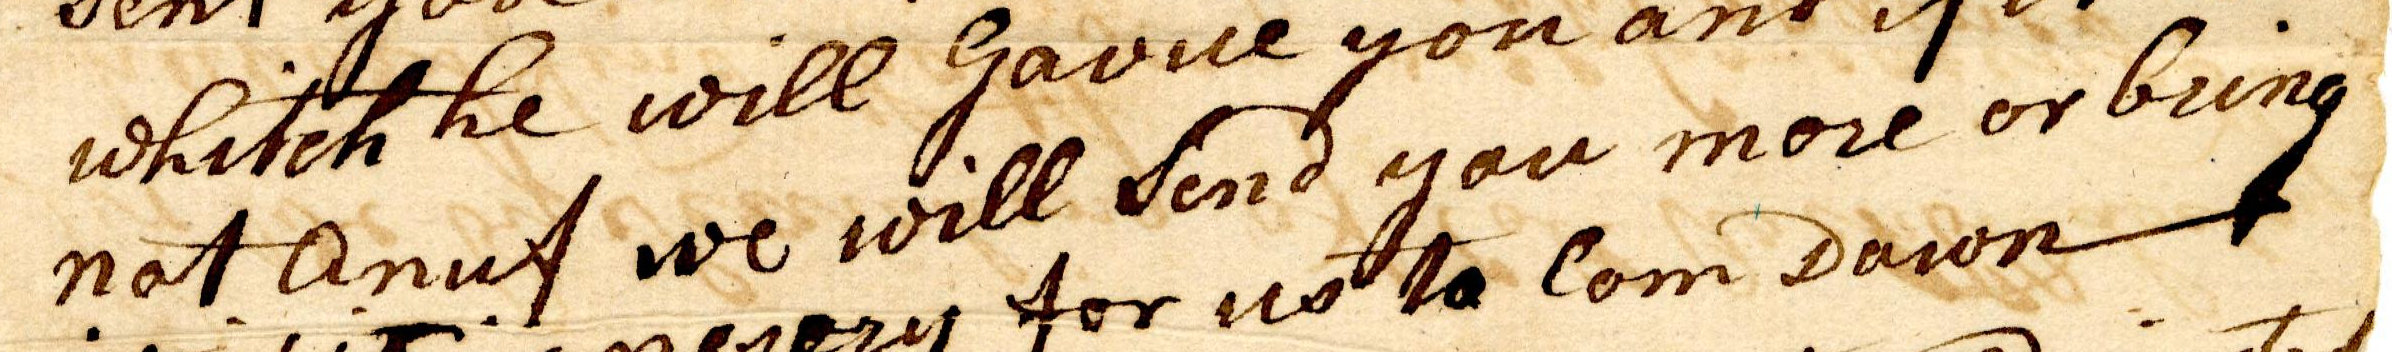not Anuf we will send you more or bring
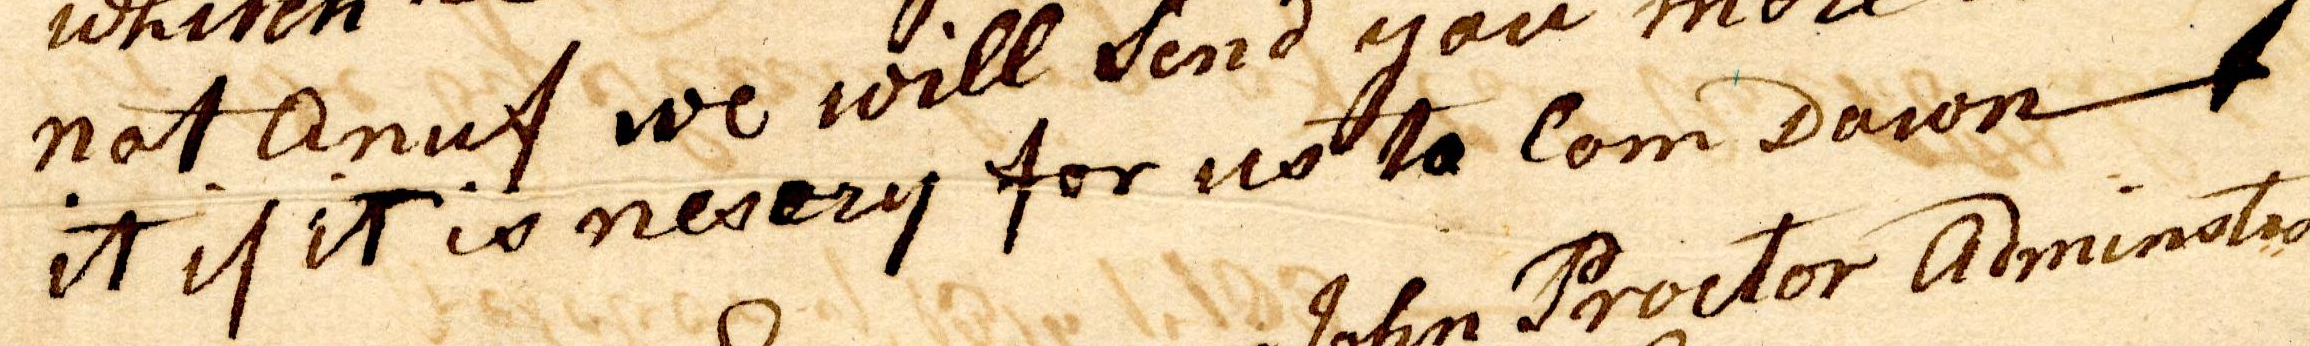it if it is nesery for us to Com dawn
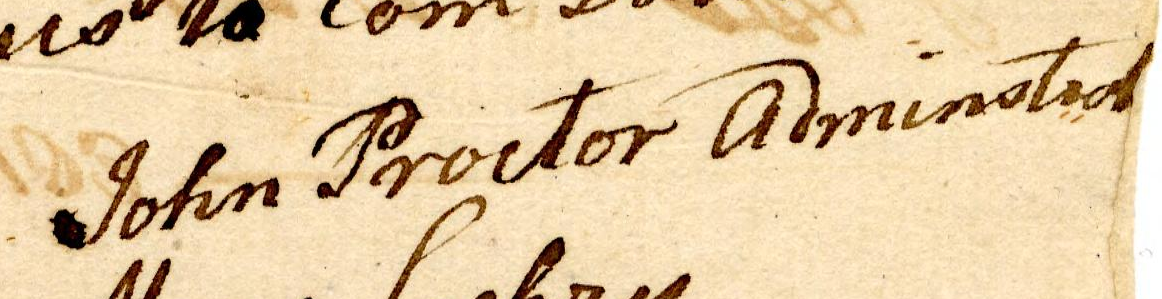John Proctor Adminstror
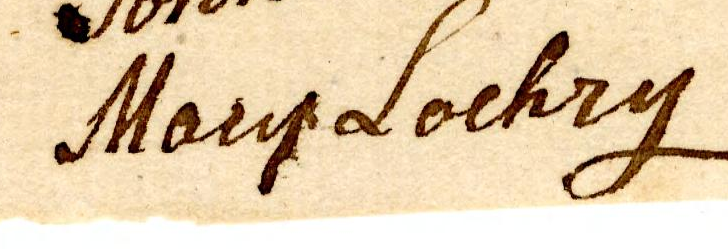Mary Lochry
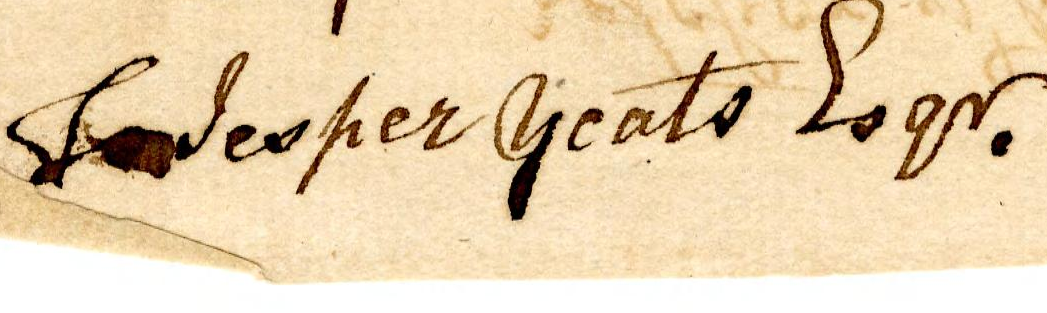To Jesper Yeats Esqr.
